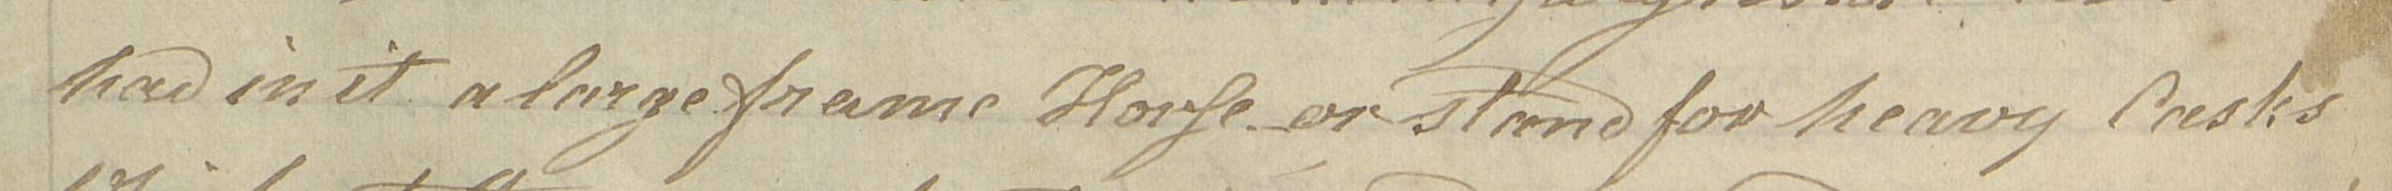had in it a large frame Horse or stand for heavy Cresks
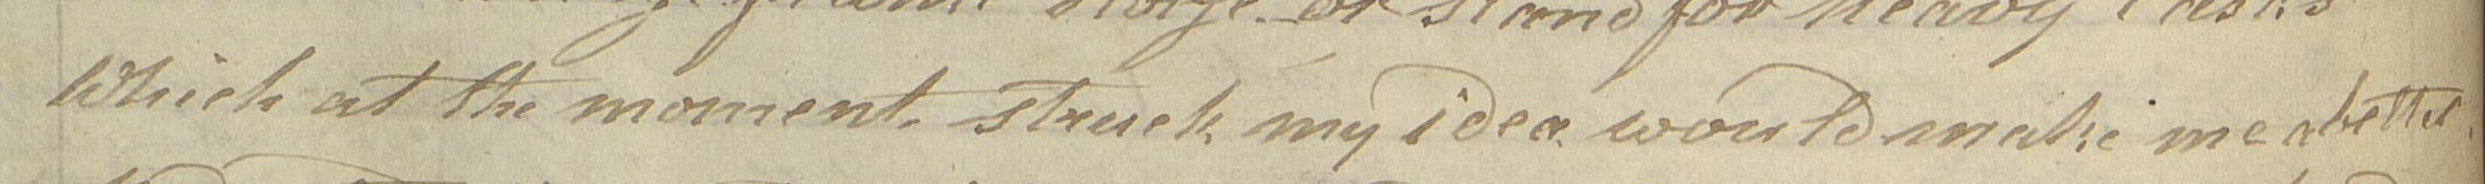Which at the moment struck my idea would make me a better
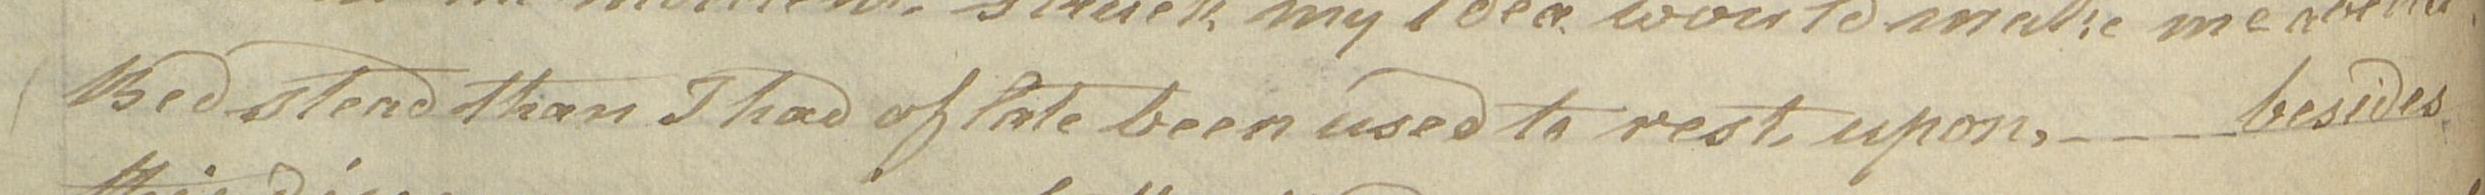Bed stead than I had of late been used to rest upon, besides
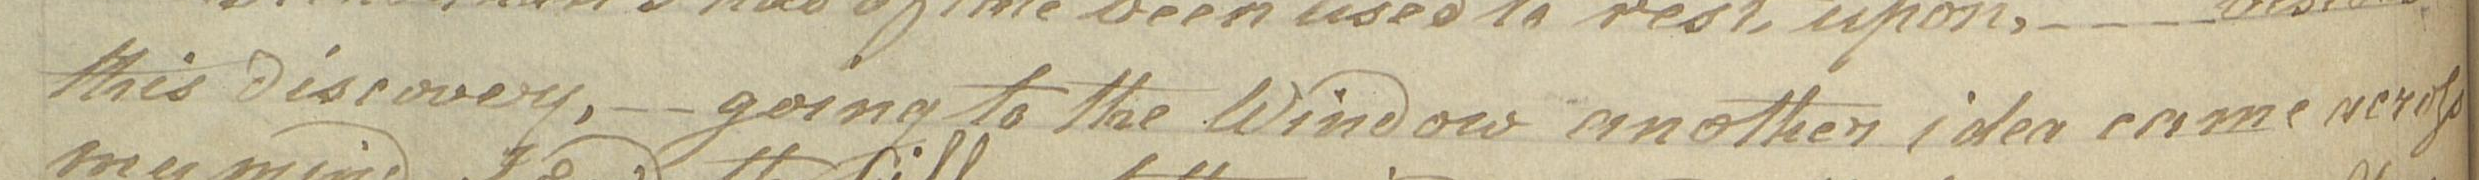this discovey, going to the Window another idea came across
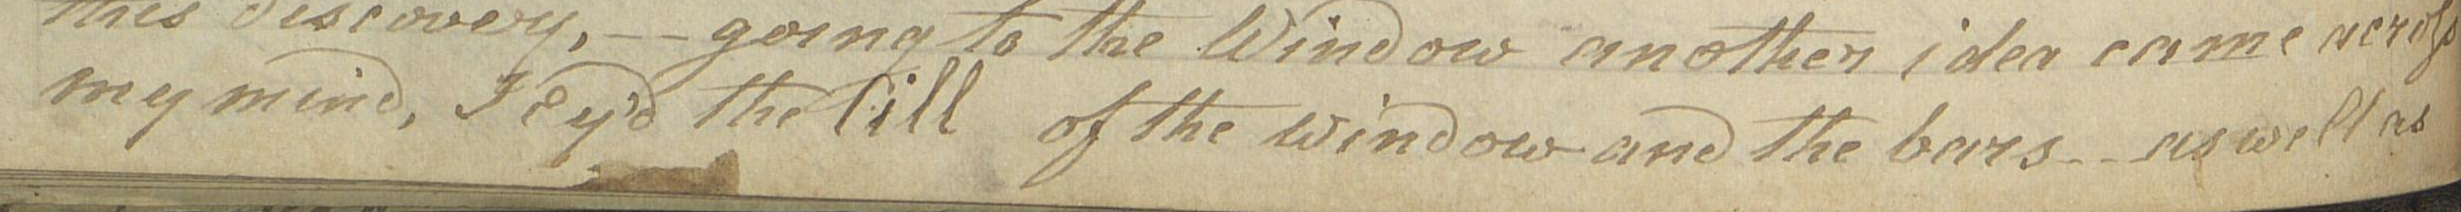my mind, I Ey'd the cill of the window and the bars as well as
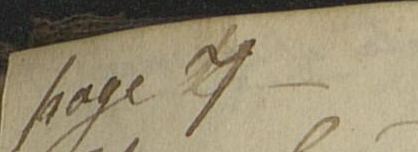page 7
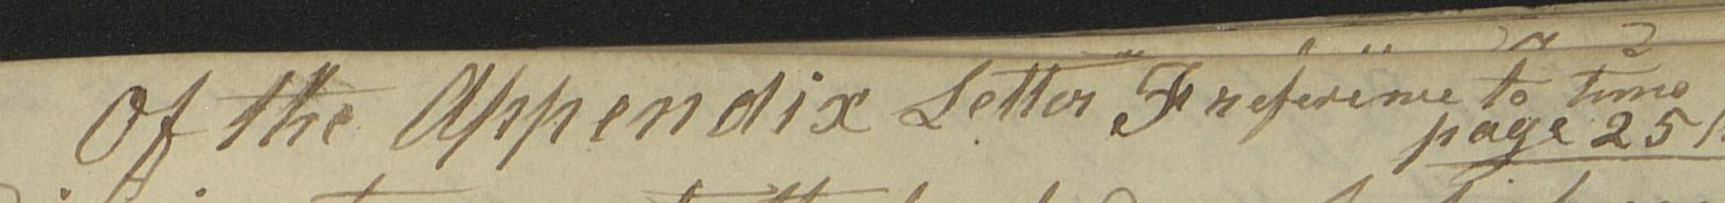of the Appendix Letter F reference to time
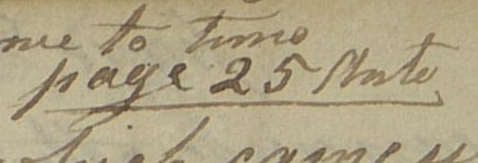page 25 Ante
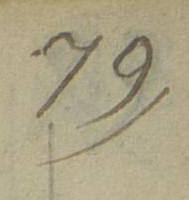79
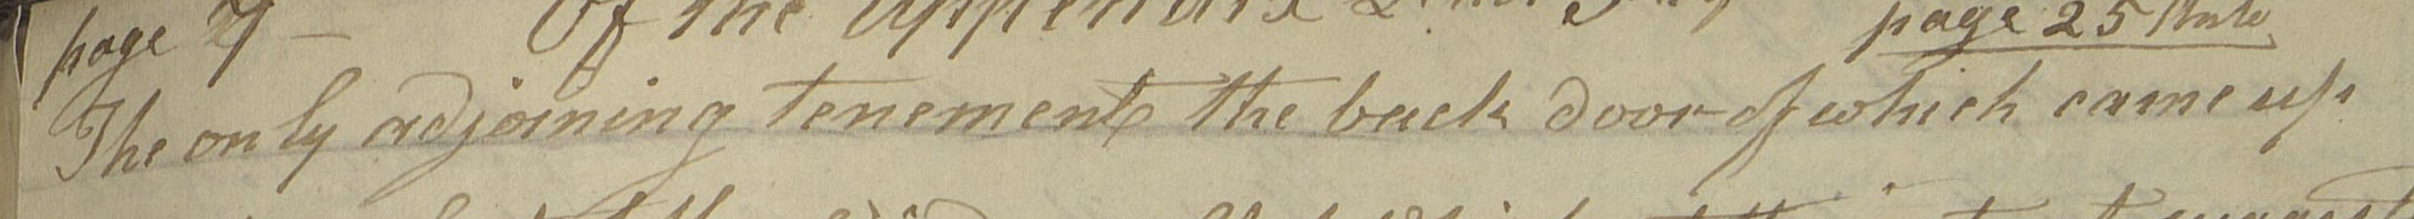The only rejoining tenement the back door of which came up
